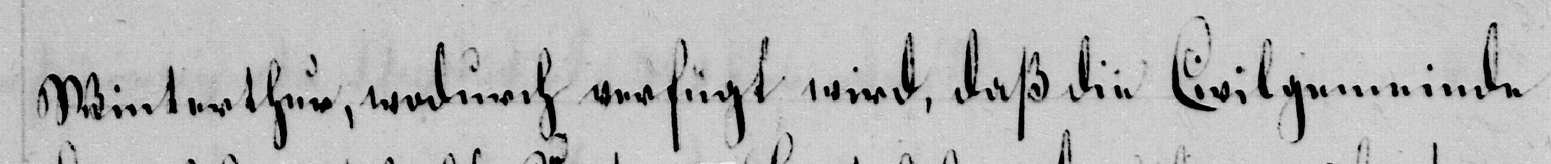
Winterthur, wodurch verfügt wird, daß die Civilgemeinde
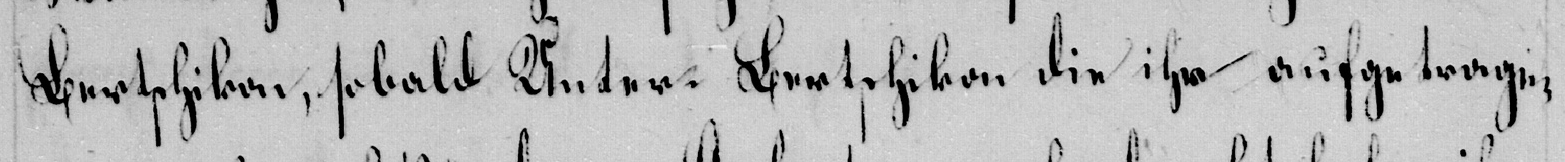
Bertschikon, sobald Unter-Bertschikon die ihr aufgetrage¬
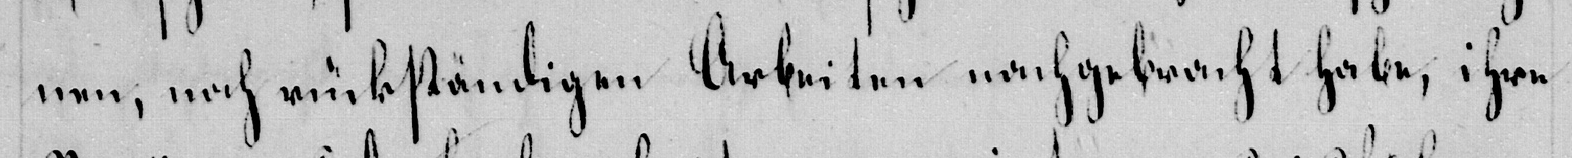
nen, noch rückständigen Arbeiten nachgebracht habe, ihre
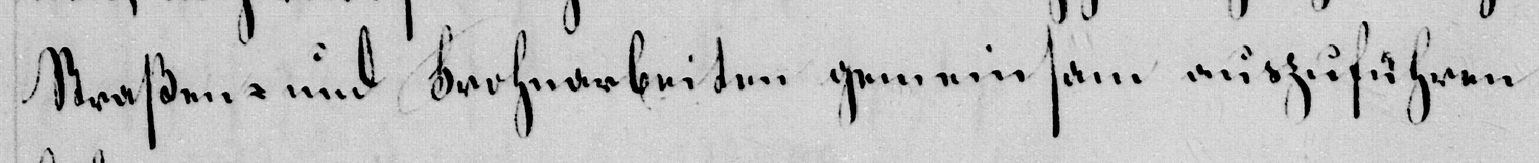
Straßen- und Bauarbeiten gemeinsam auszuführen
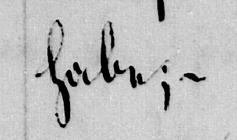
habe; –
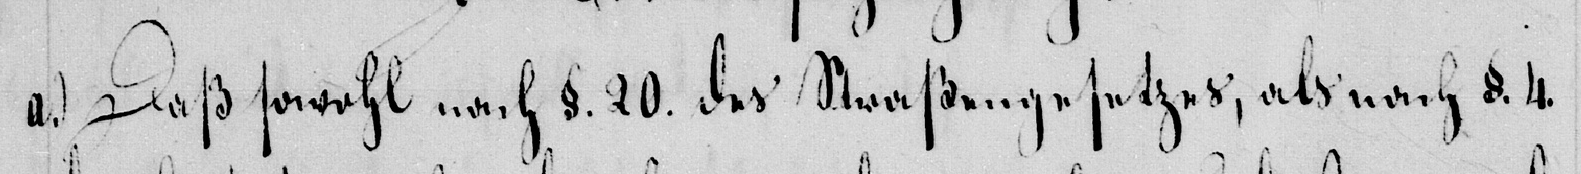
a.) Daß sowohl nach §. 20. des Straßengesetzes, als nach §. 4.
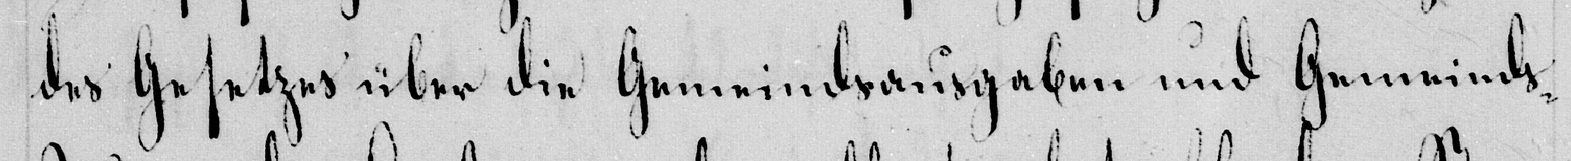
des Gesetzes über die Gemeindsausgaben und Gemeinds¬
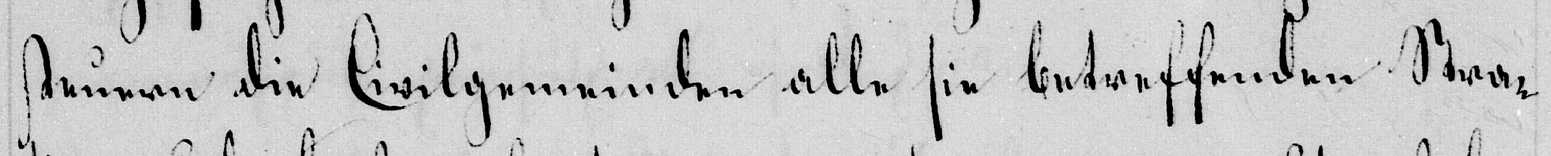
steuern die Civilgemeinden alle sie betreffenden Stra¬
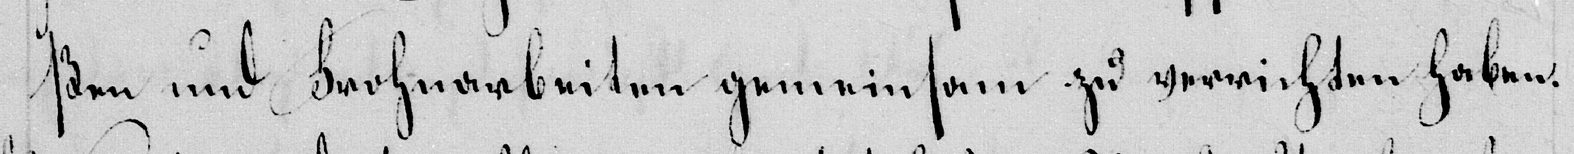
ßen und Frohnarbeiten gemeinsam zu verrichten haben.
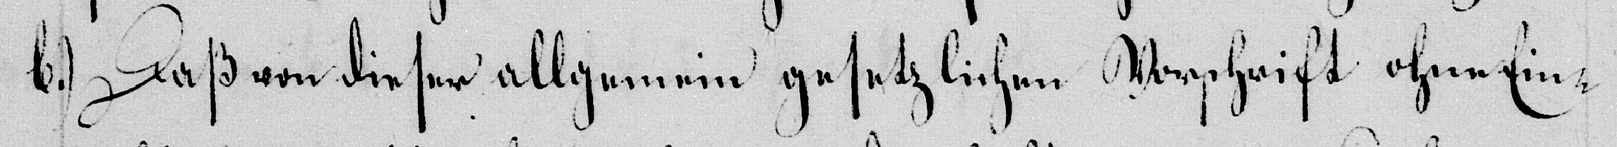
b.) Daß von dieser allgemein gesetzlichen Vorschrift ohne Ein¬
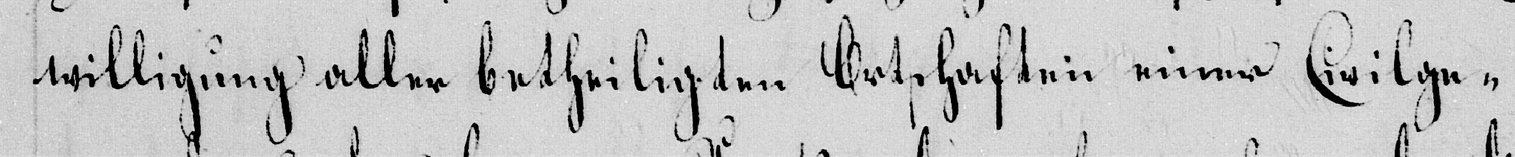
willigung aller betheiligten Ortschaften einer Civilge¬
